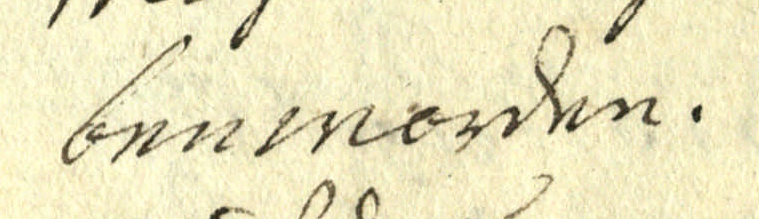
ben worden.
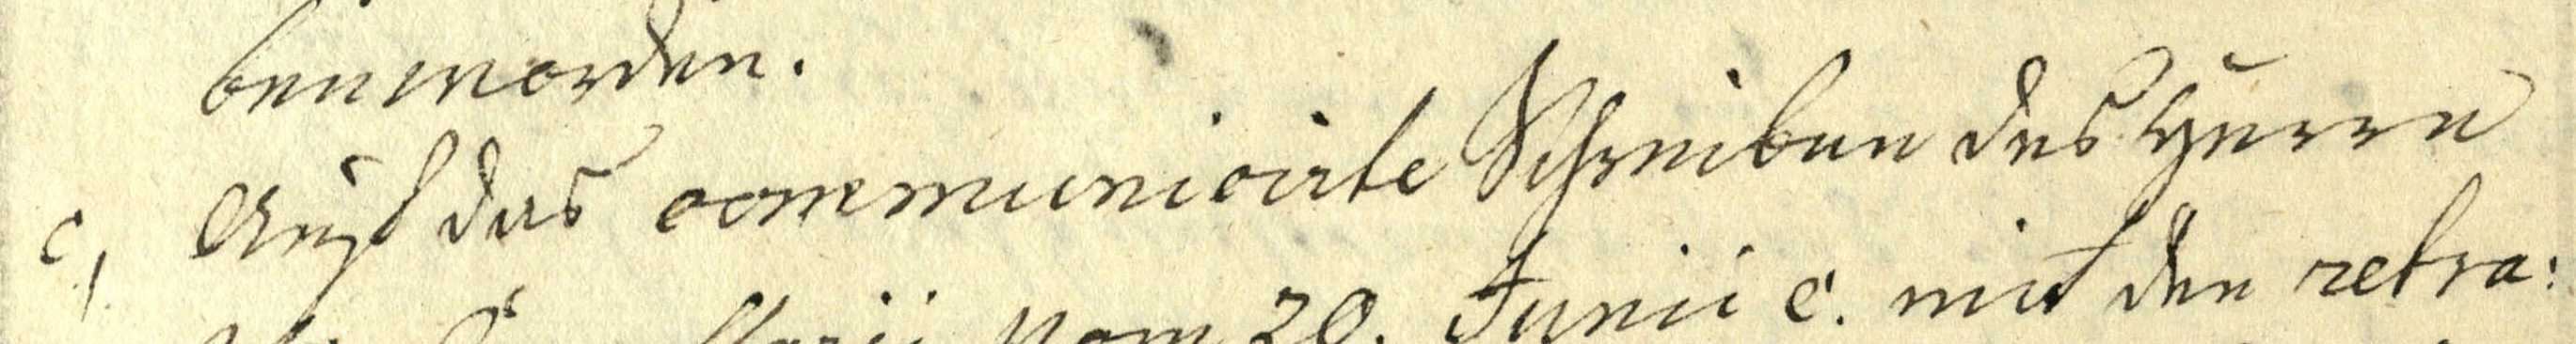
c, Auf das communicirte Schreiben des Herrn
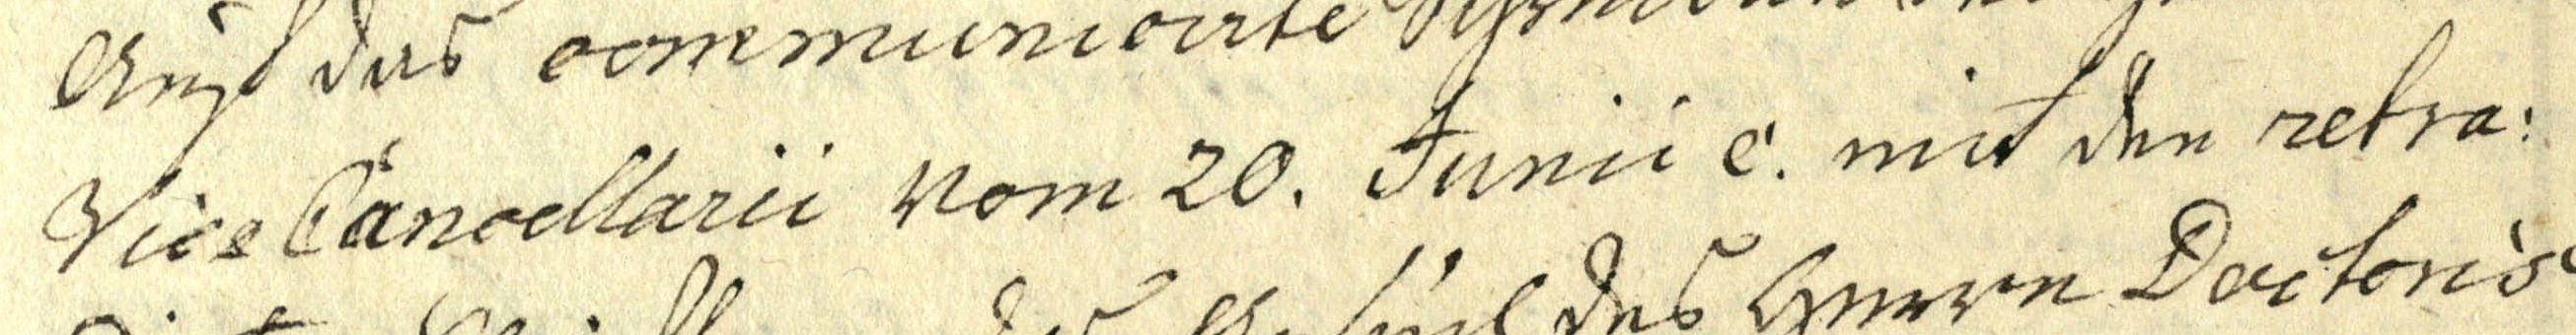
Vice Cancellarii vom 20. Junii c. mit den retra¬
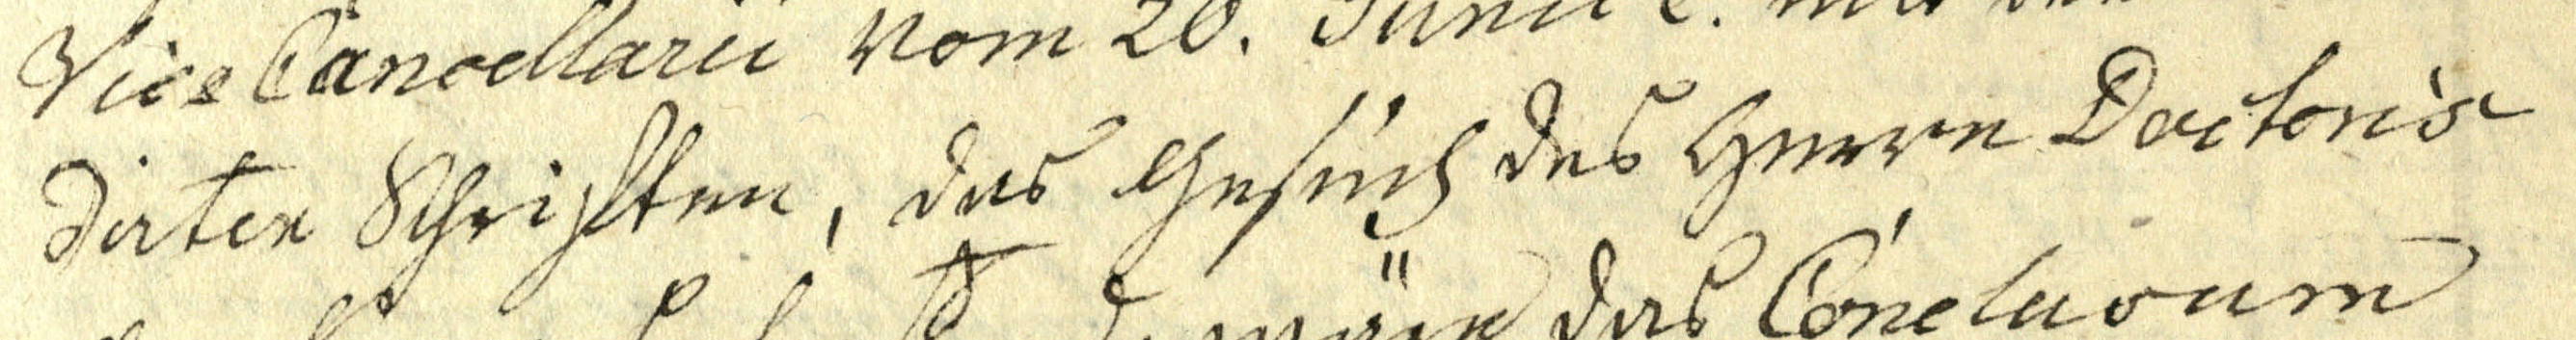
dirten Schriften, das Gesuch des Herrn Doctoris
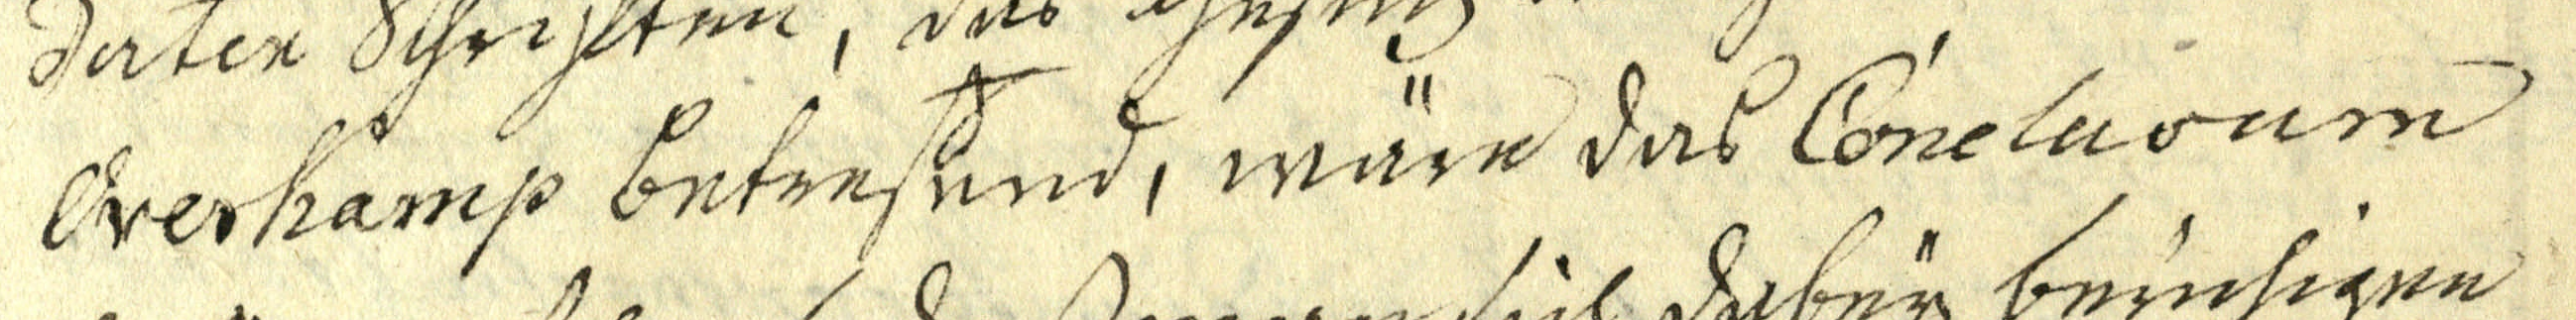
Overkamp betreffend, wäre das Conclusum
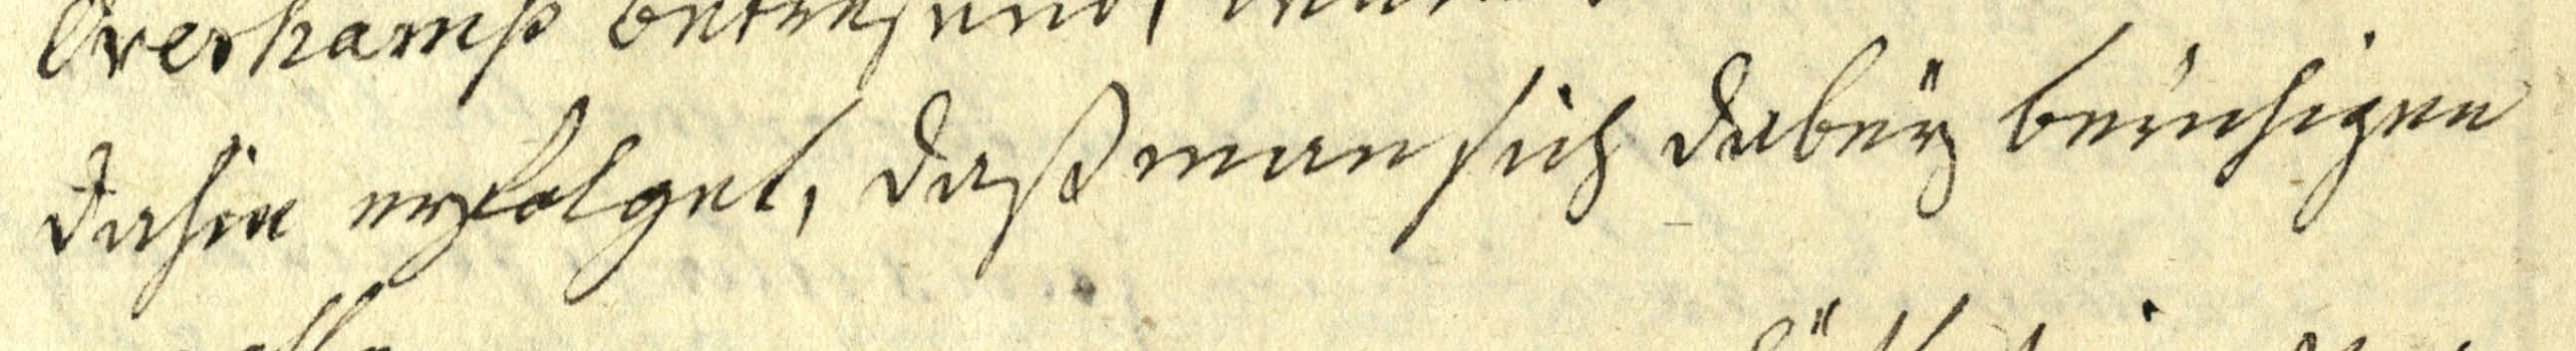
dahin erfolget, daß man sich dabeÿ beruhigen
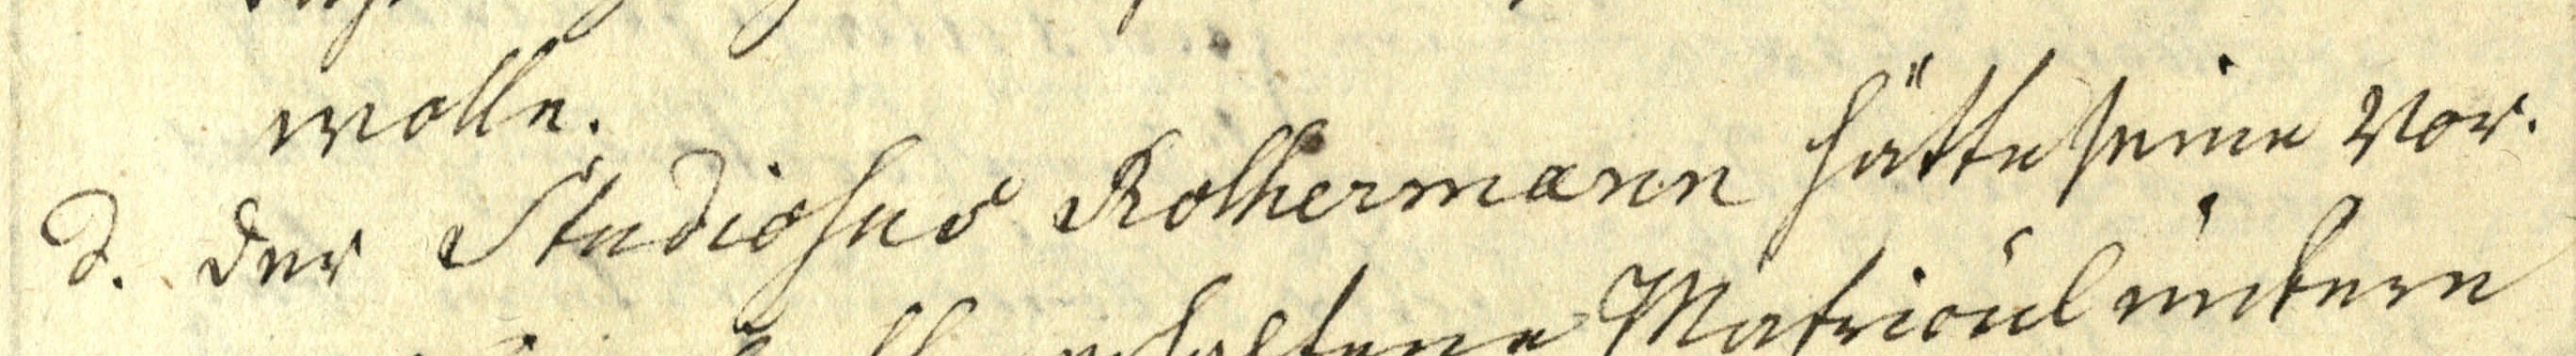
d. der Studiosus Rothermann hätte seine vor¬
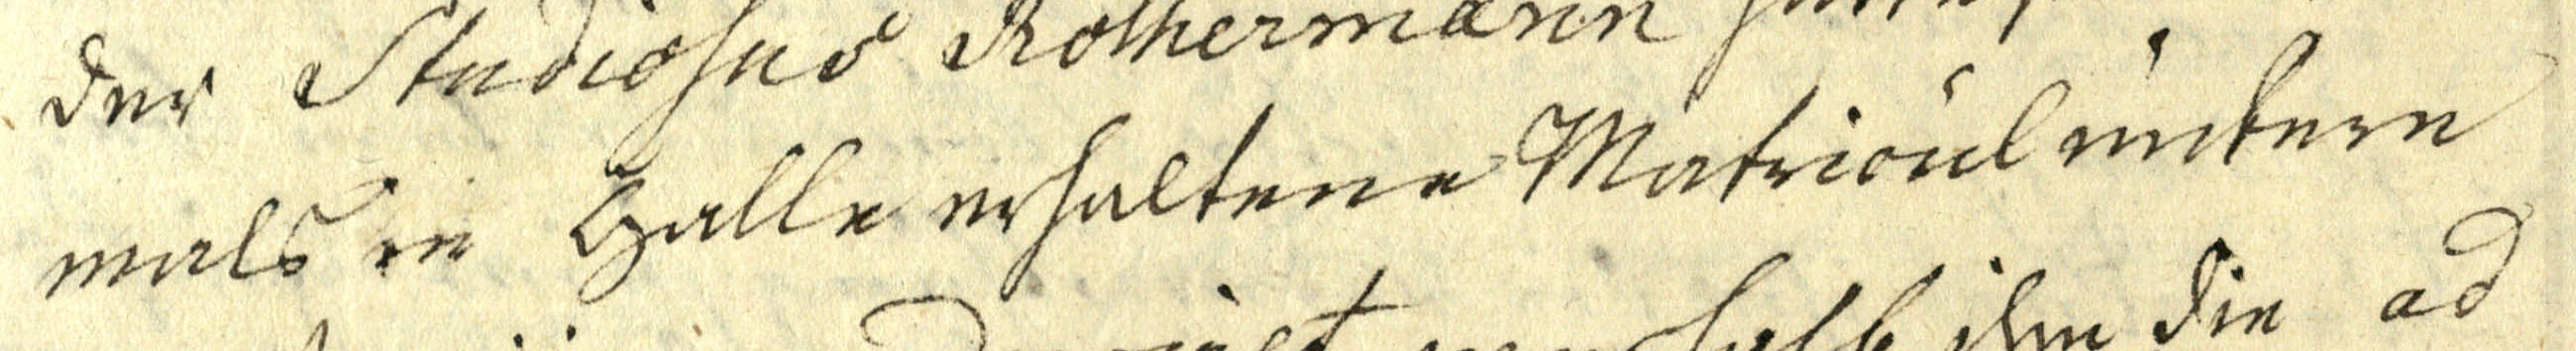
mals in Halle erhaltene Matricul untern
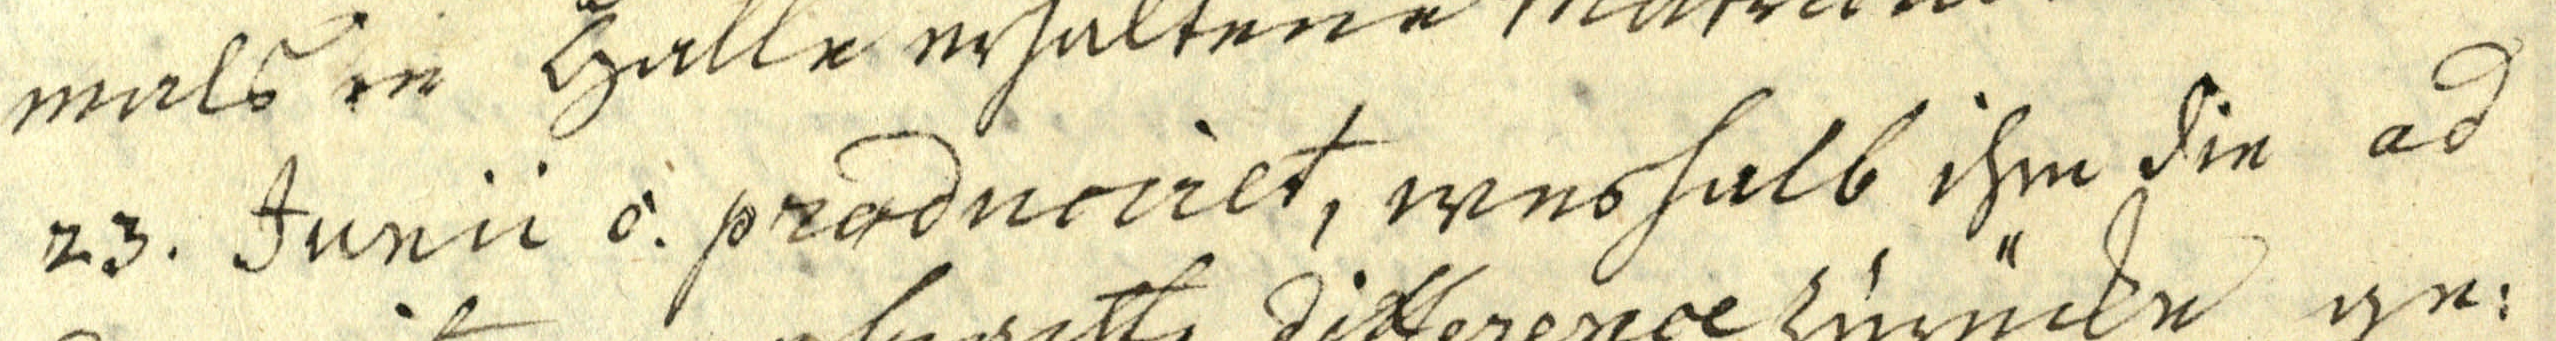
23. Junii c. produciret, weshalb ihm die ad
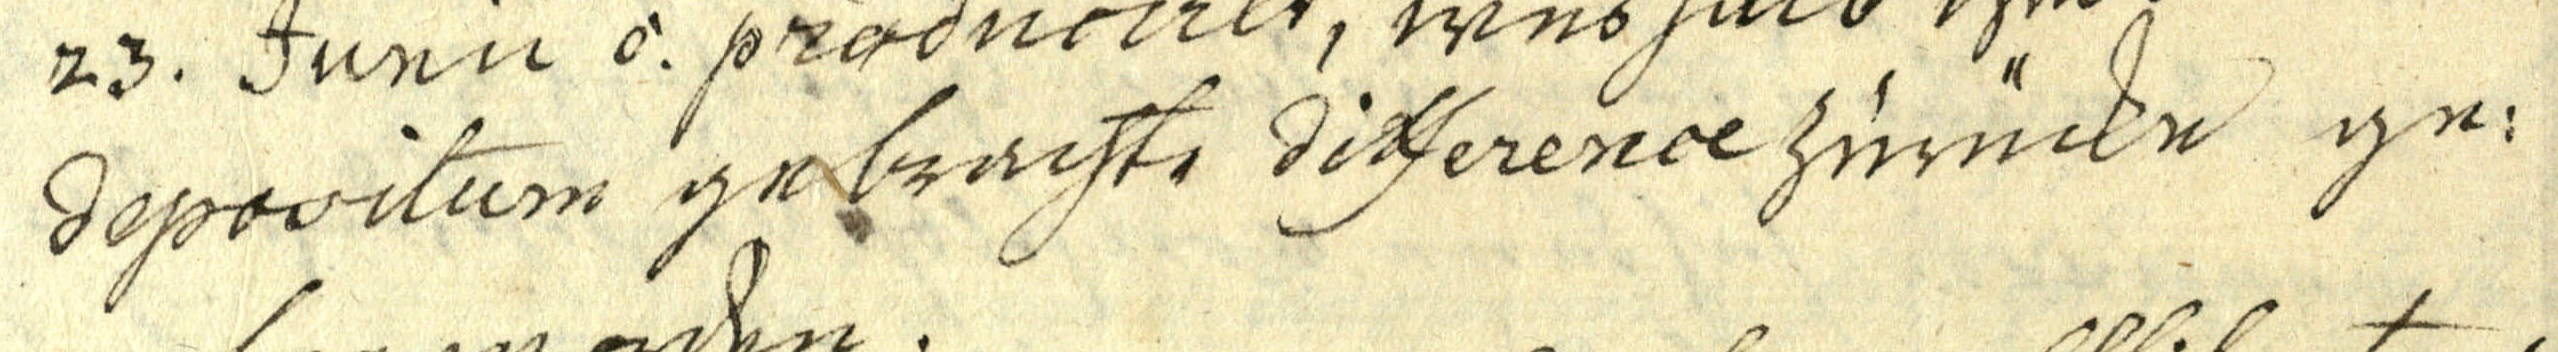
depositum gebrachte difference zurücke ge¬
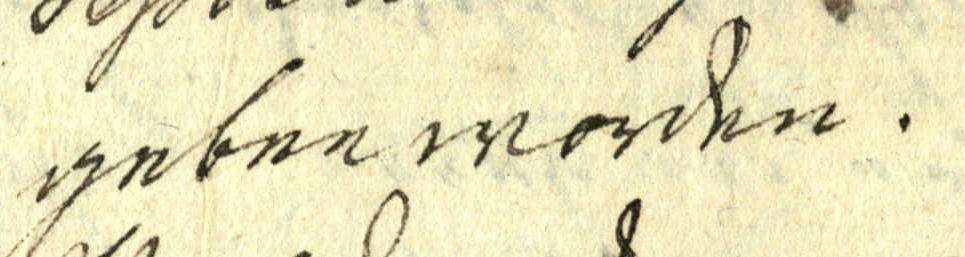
geben worden.
